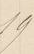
19
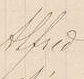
Alfred
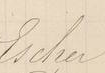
Escher
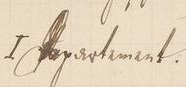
de Direction du
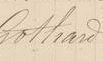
Gothard
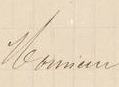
Monsieur
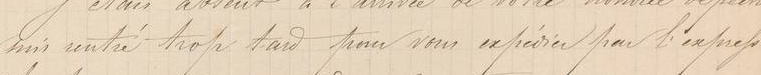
suis rentré trop tard pour vous expédier par l'express
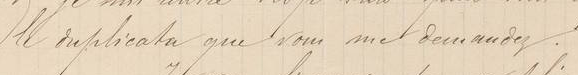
le duplicata que vous me demandez.
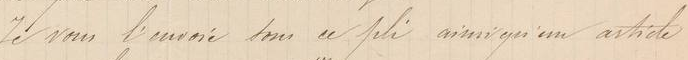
Je vous l'envoie sous ce pli ainsi qu'un article
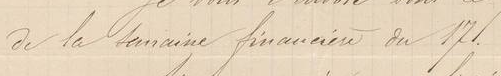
de la semaine financière du 17.
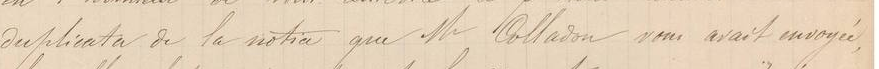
duplicata de la notice que MrColladon vous avait envoyée,
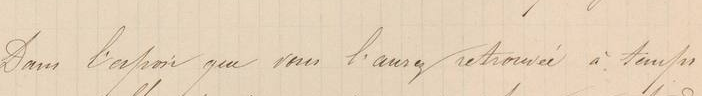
Dans l'espoir que vous l'aurez retrouvée à temps
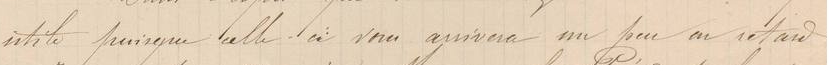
utile puisque celle-ci vous arrivera un peu en retard.
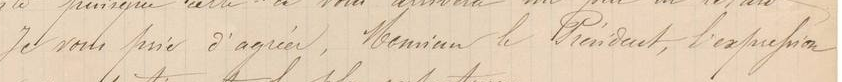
Je vous prie d'agréer, Monsieur le Président, l'expression
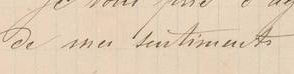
de mes sentiments
